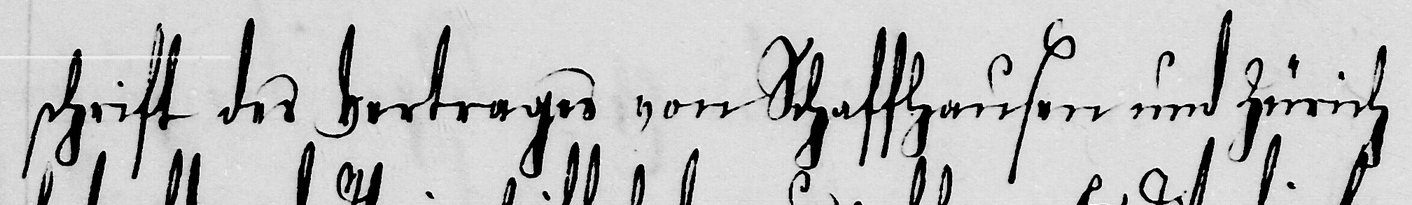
schrift des Vertrages von Schaffhausen und Zürich
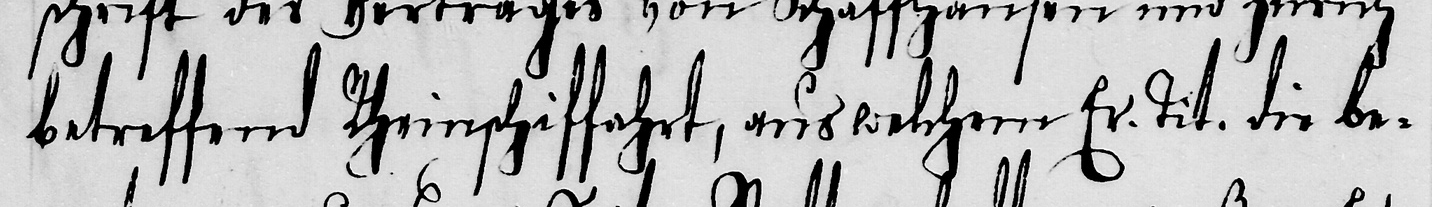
betreffend Rheinschiffahrt, aus welchem Er. Tit. die b¬
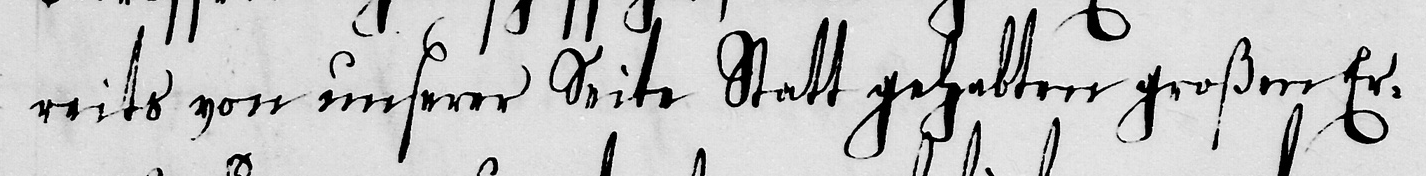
ereits von unserer Seite Statt gehabten großen Er¬
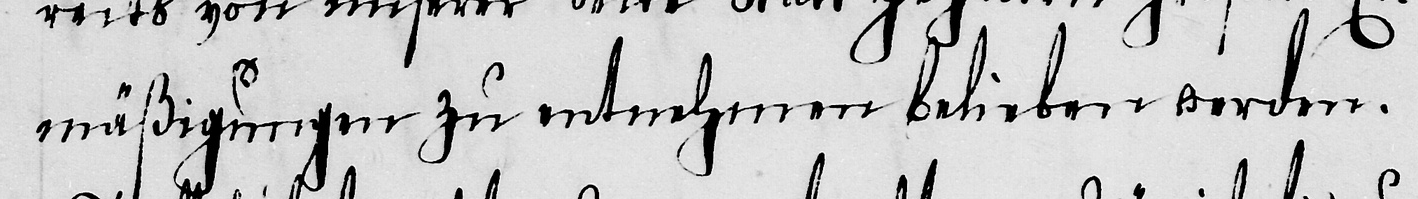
mäßigungen zu entnehmen belieben werden.
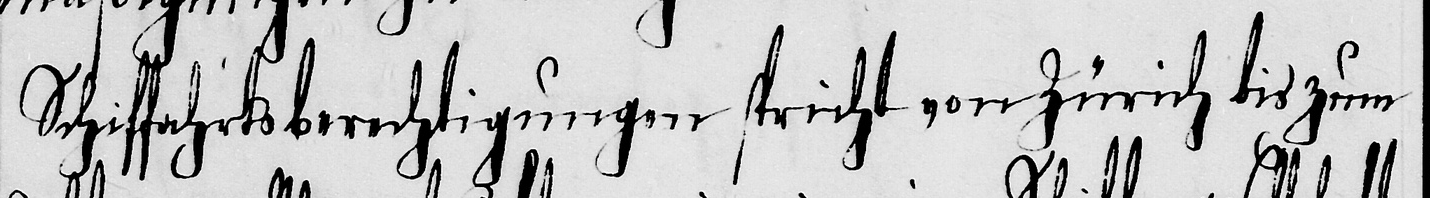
Schiffahrtsberechtigungen spricht von Zürich bis zum
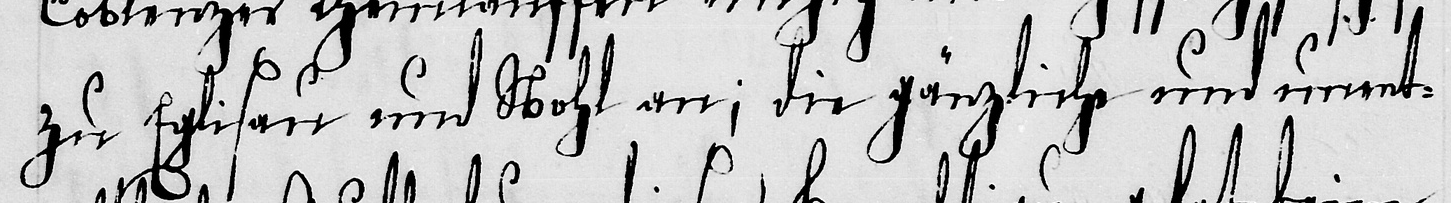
zu Eglisau und Nohl an; die gänzliche und unent¬
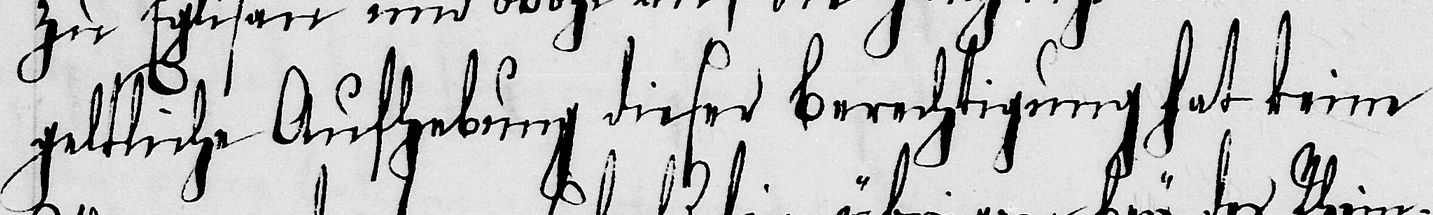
geltliche Aufhebung dieser Berechtigung hat keine
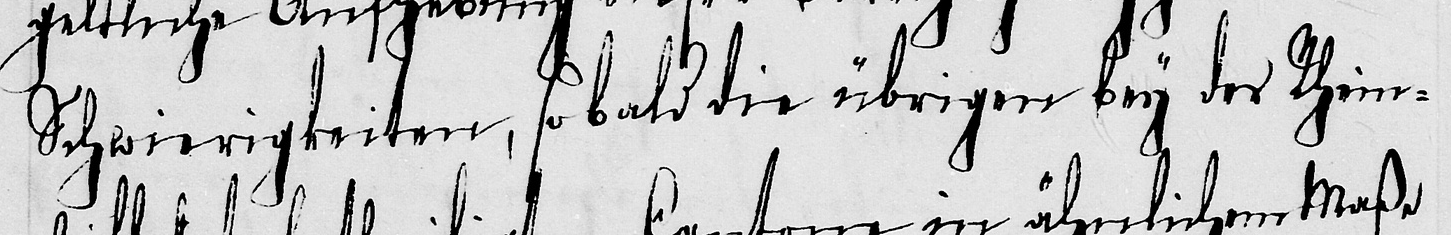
Schwierigkeiten, sobald die übrigen bey der Rhein¬
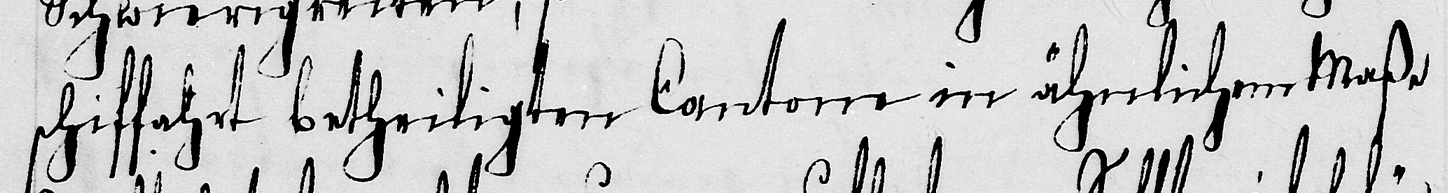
schiffahrt betheiligten Cantone in ähnlichem Maße
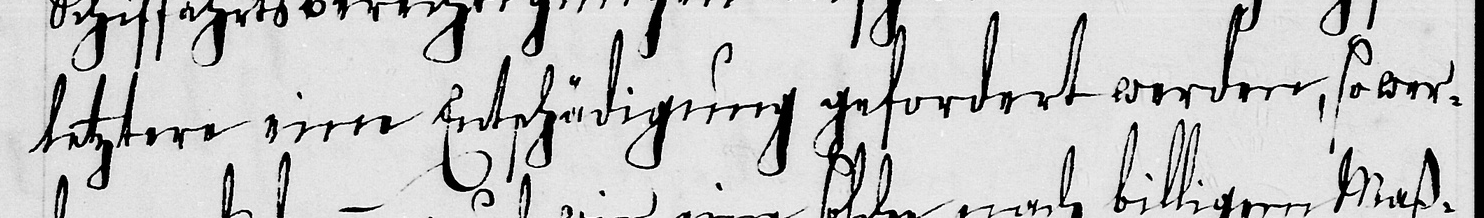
letztere eine Entschädigung gefordert werden, so wer¬
